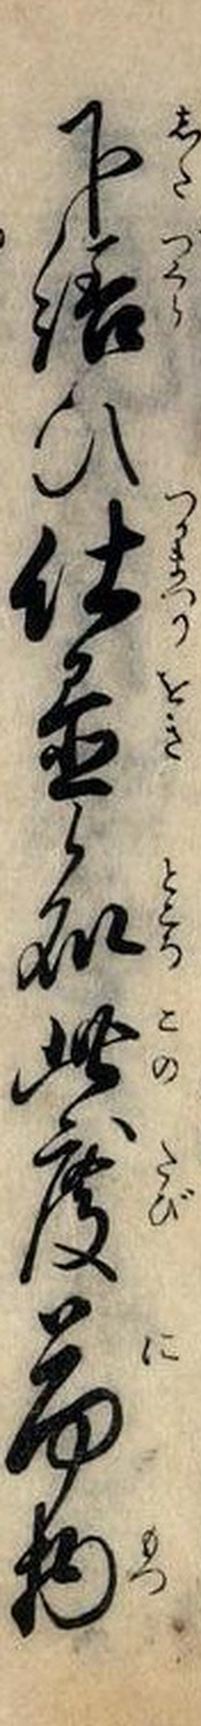下繕ひ仕置候処此度荷物
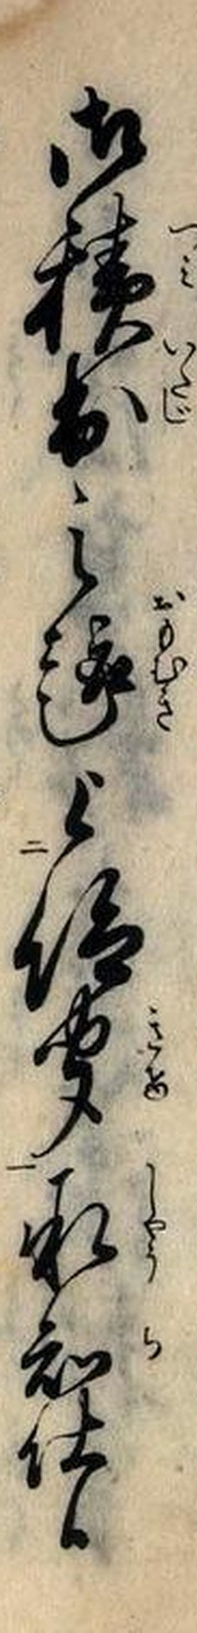御積出之趣被仰聞承知仕候
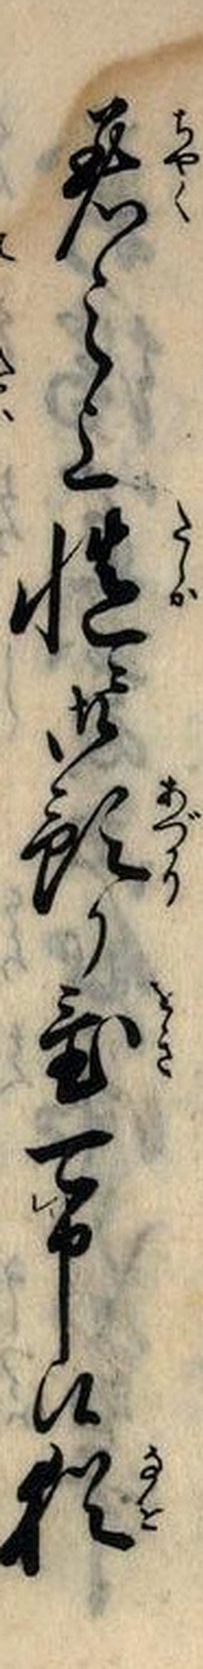着之上慥に御預り置可申候猶
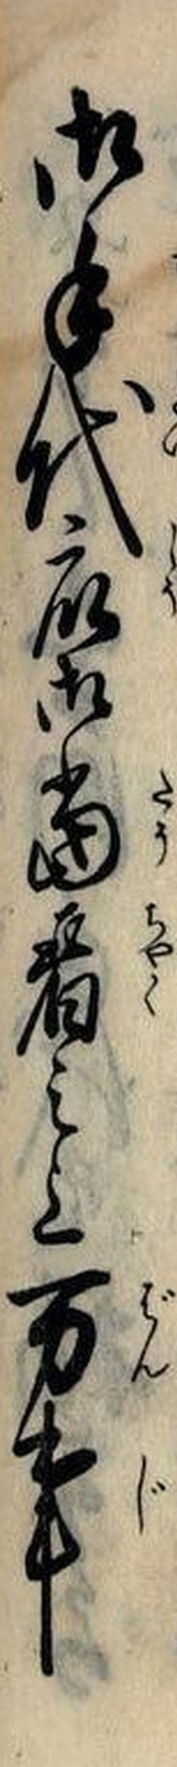御手代衆御當着之上万事
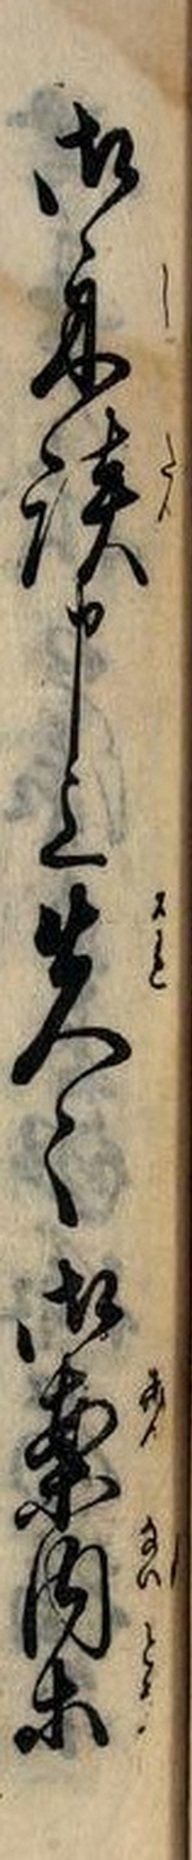御示談申上夫々御案内等
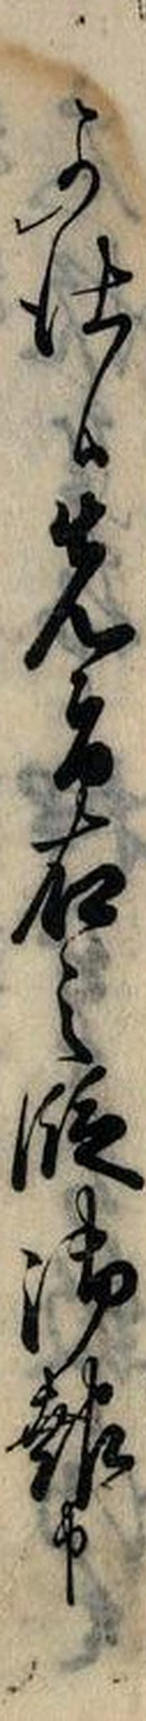可仕候先者右之段御報申
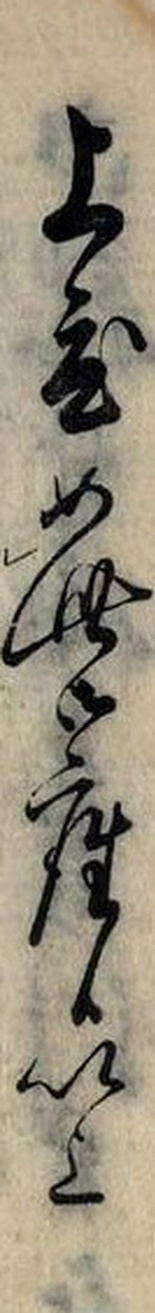上度如此御座候以上
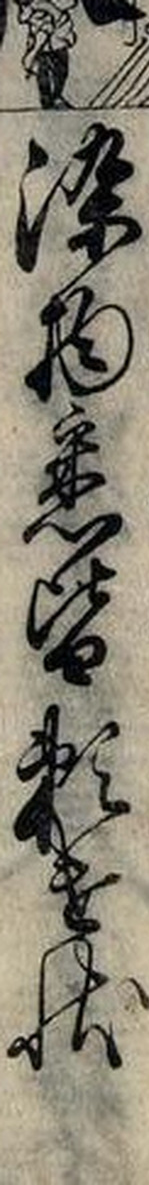染物悉皆頼遣状

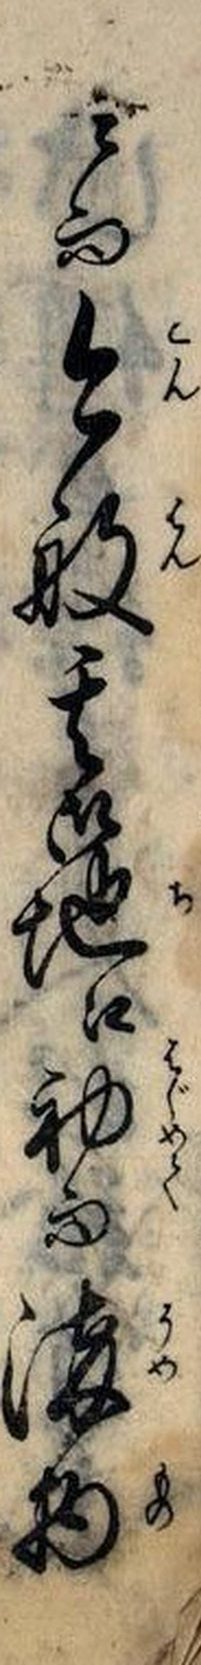に而今般其御地江初而染物
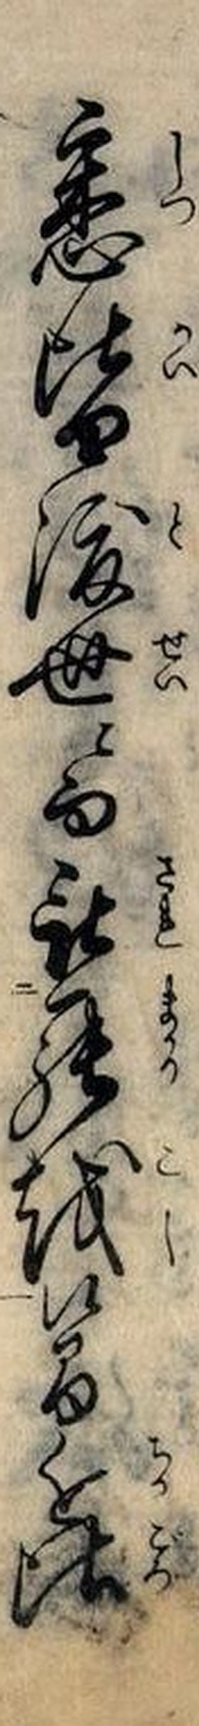悉皆渡世に而被罷越候間近比
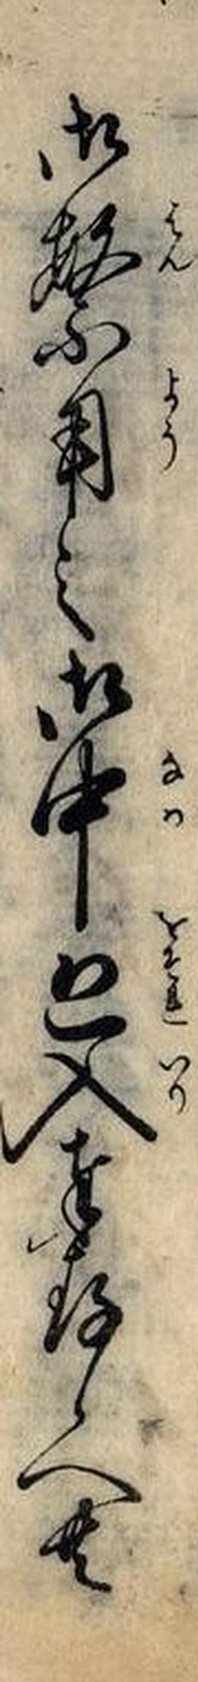御繁用之御中恐入奉存候へ共
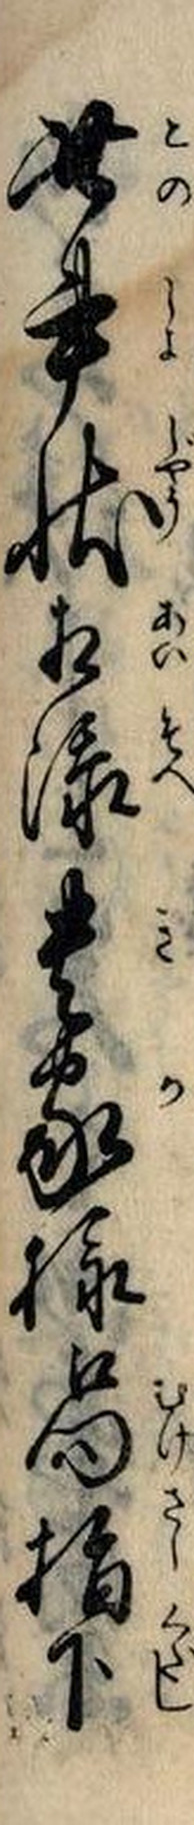此書状相添貴家様江向指下
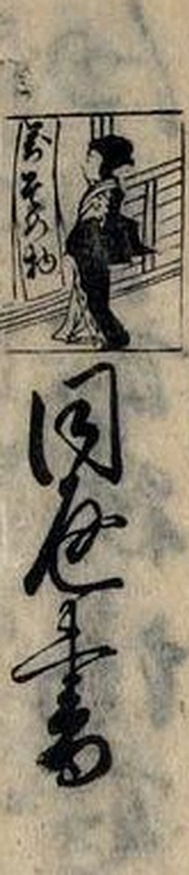同返書
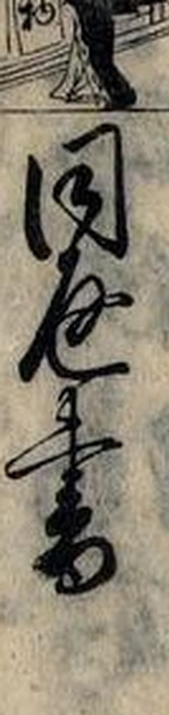同返書
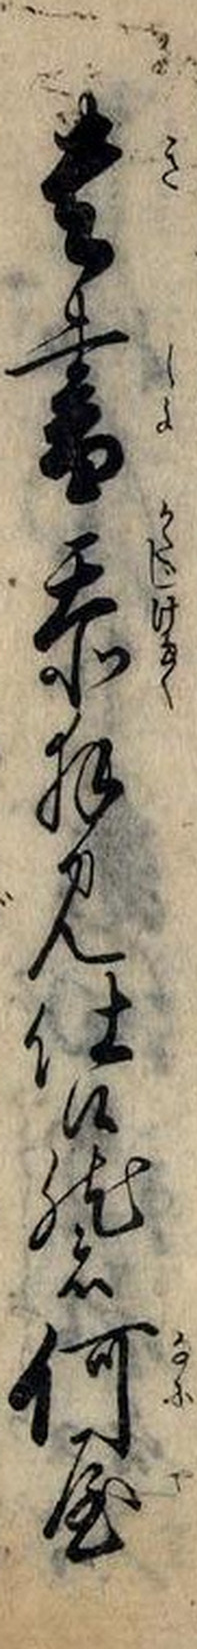貴書忝拝見仕候然者何屋
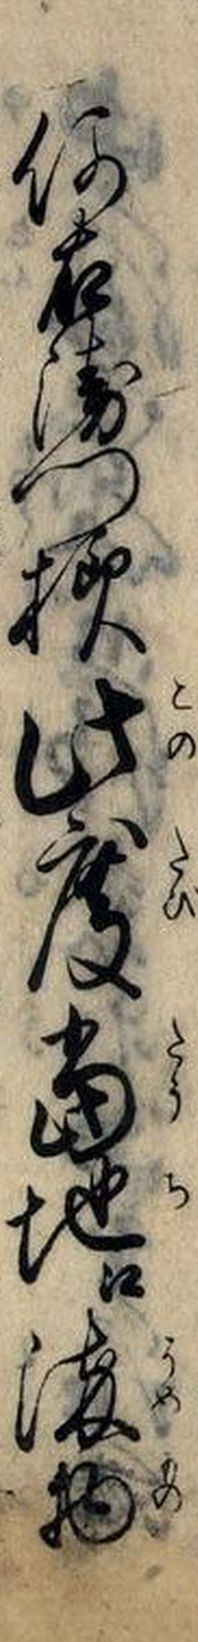何右衛門様此度當地江染物
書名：大成用文章（往来物）
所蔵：福井県文書館 Fukui Prefectural Archives
